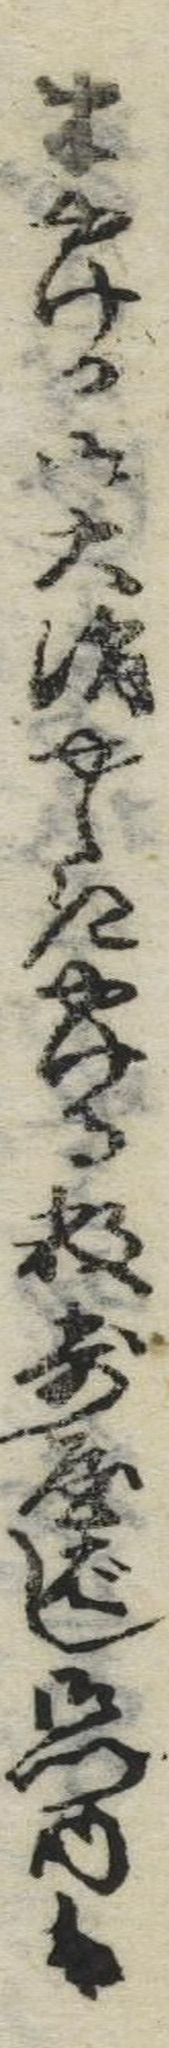やける御火消やしきやけるすきやばし御門内も
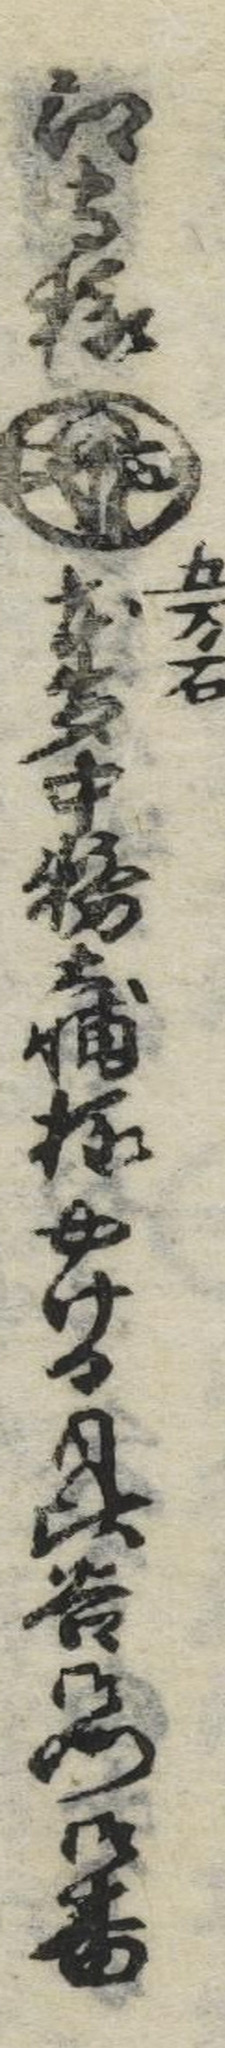江守様五万石本多中務大輔様やける日比谷御門御番
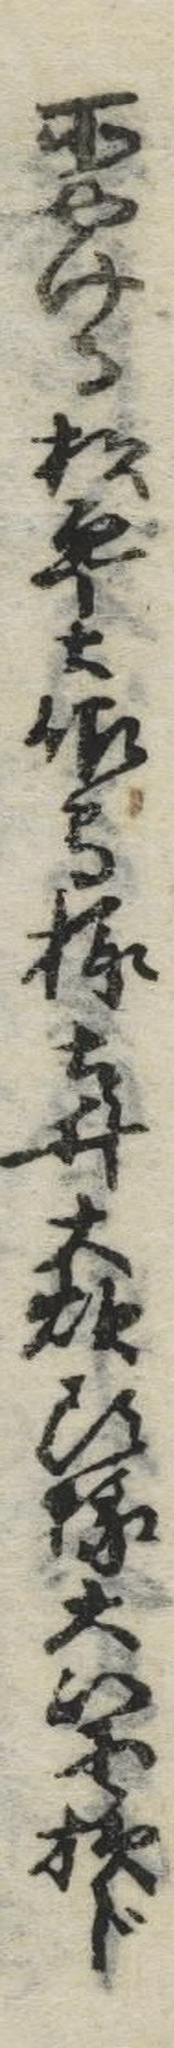所やける松平土佐守様土井大炊頭様大いに損じ
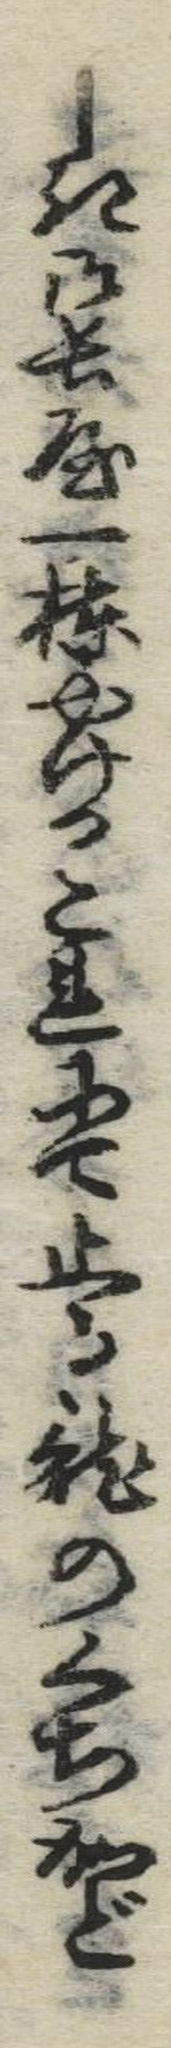しき御長屋一棟やけるこれにて止る龍のくちかど
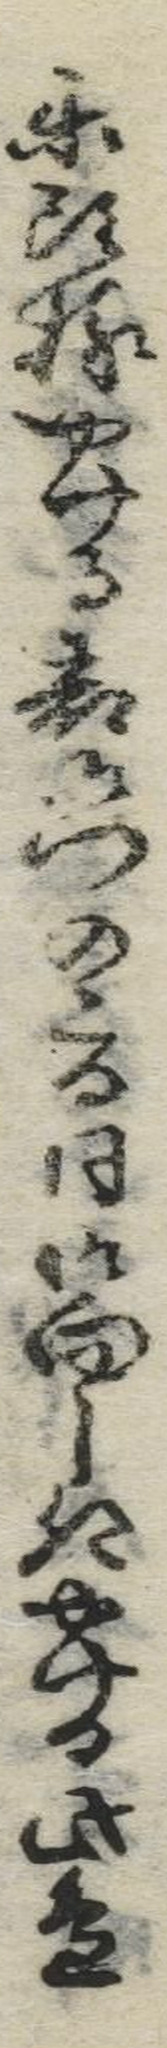楽頭様やける表御門のこる同御向しきやける此辺
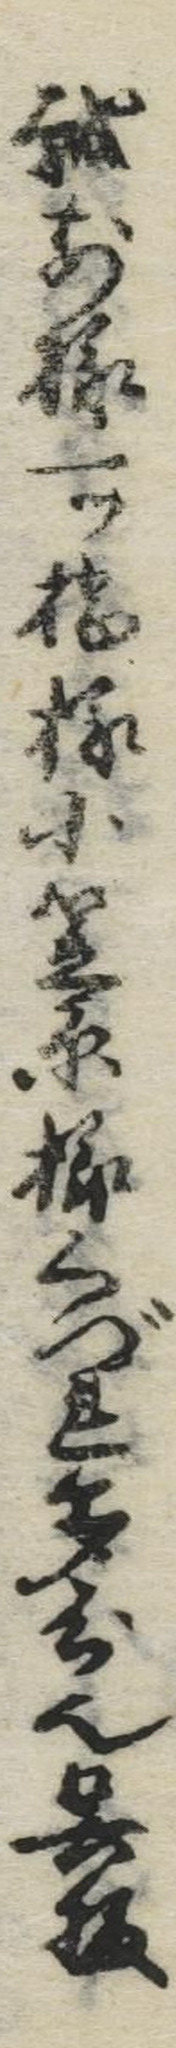越前様一ッ橋様小笠原様くづれ多分也呉服
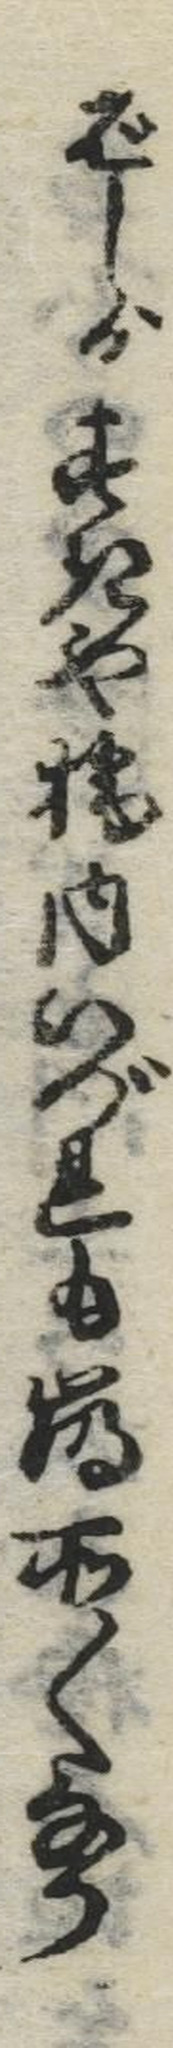ばしゟすきや橋内いづれも崩所々なり
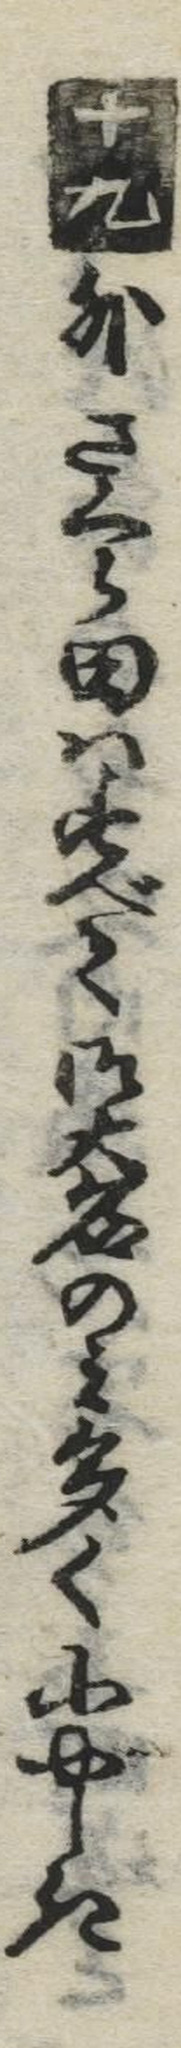十九外さくら田はすべて御大名のミ多く小やしき
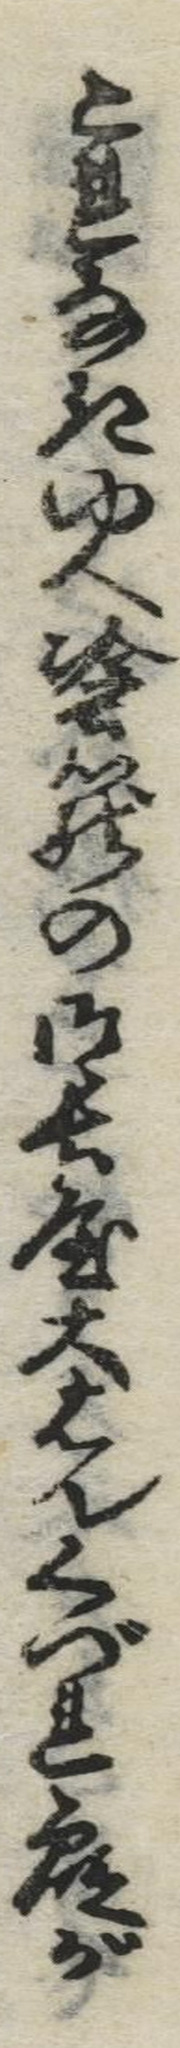これなきゆへ塗籠の御長屋大はんくづれ霞が
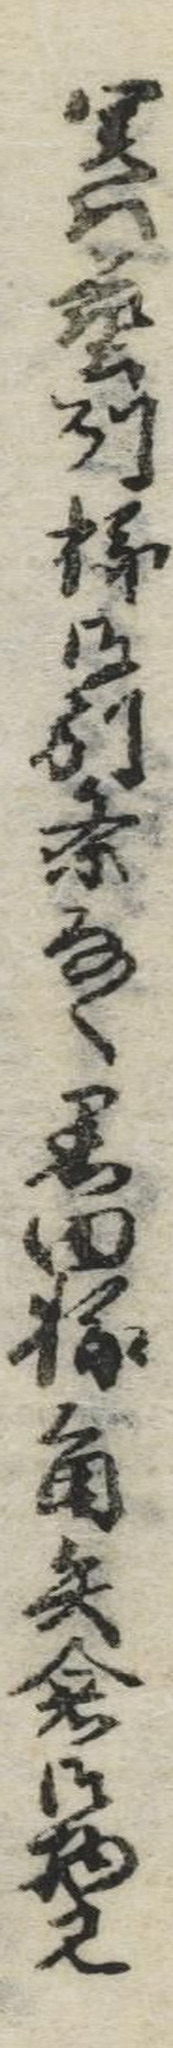関ハ芸州様御別条なく黒田様角矢倉御物見
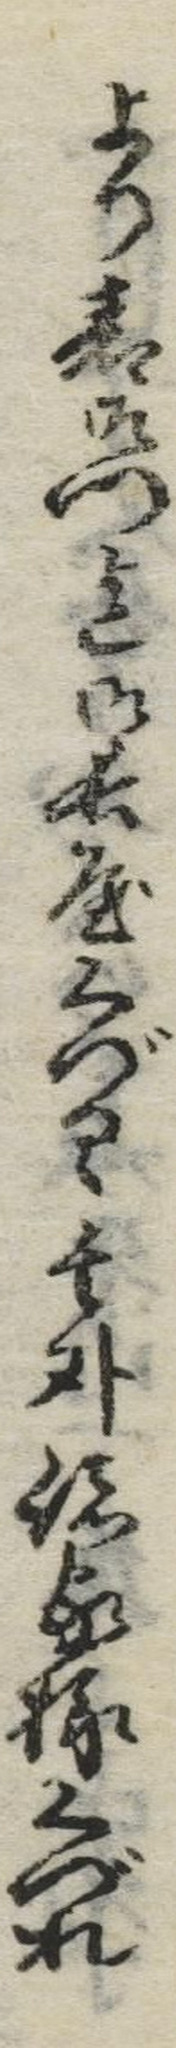より表御門迄御長屋くづるゝ其外諸家様くづれ
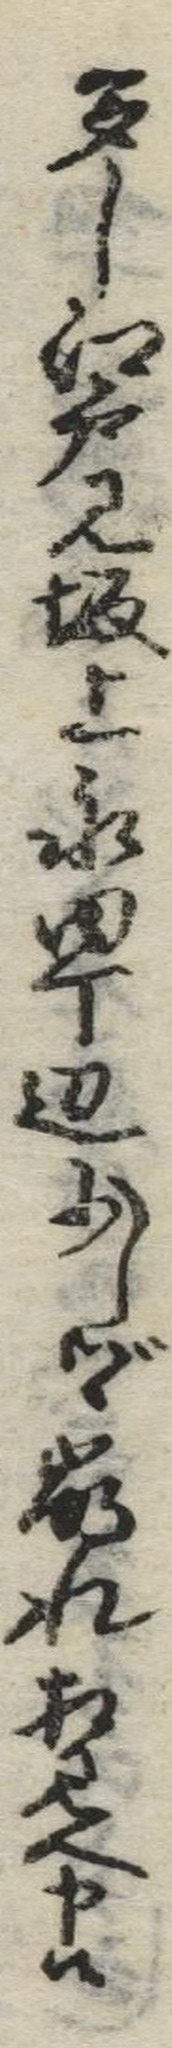多し江戸見坂上永田丁辺少しづゝ崩れ相見へ申候
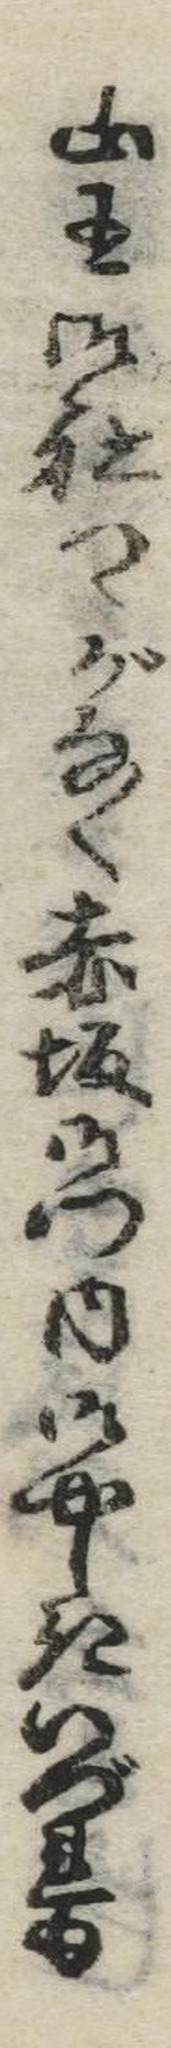山王御社つゝがなく赤坂御門ない御やしきいづれも
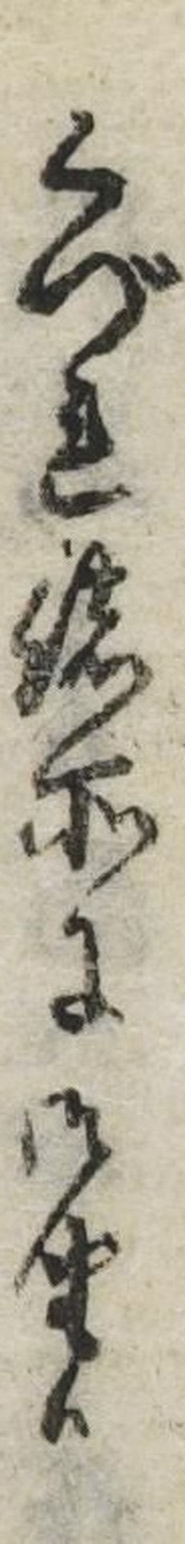くづれ諸所に御坐候
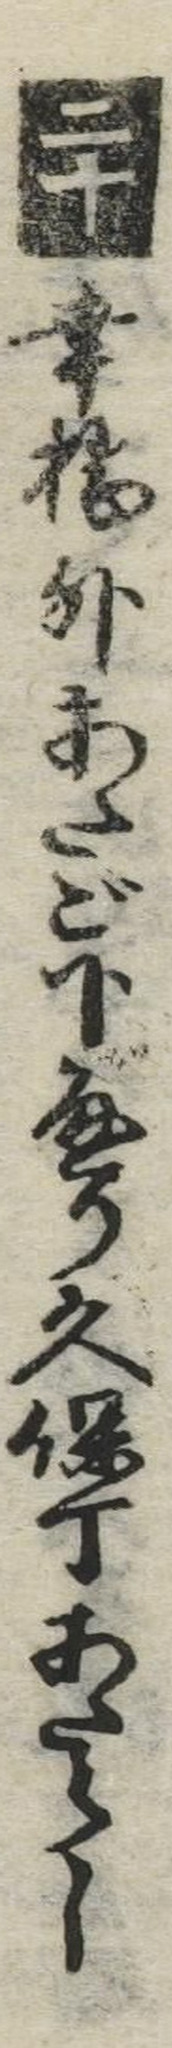二十幸橋外あたご下通り久保丁あたらし
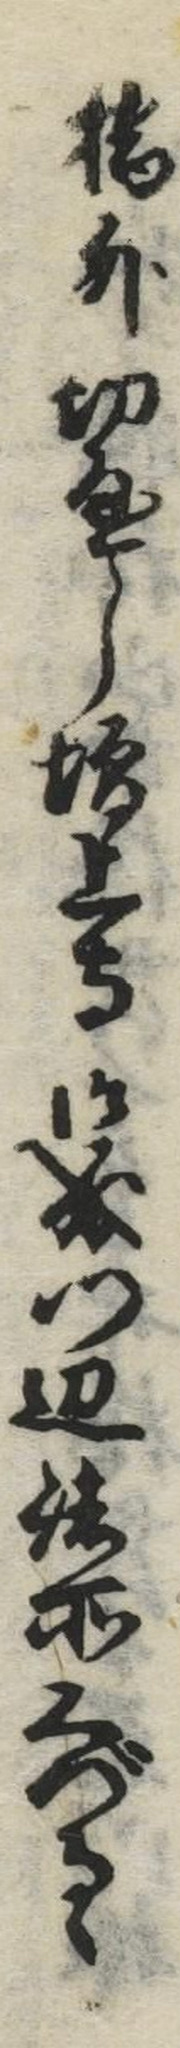橋外切通し増上寺御成門辺諸所くづるゝ
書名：安政二卯十月二日夜四ツ時過　御府内御屋敷方市中共　地震類焼場所明細書之寫　并街道筋近郷聞書
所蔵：東京大学地震研究所図書室 Earthquake Research Institute Library, The University of Tokyo, JAPAN
